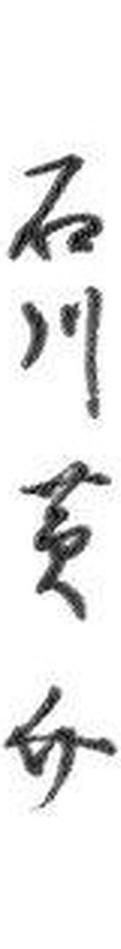石川貫介
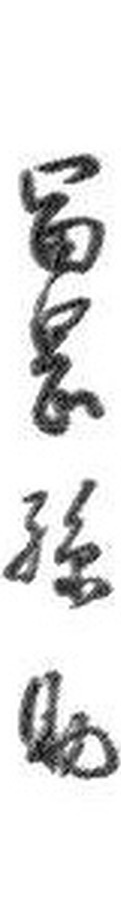冨岡孫助
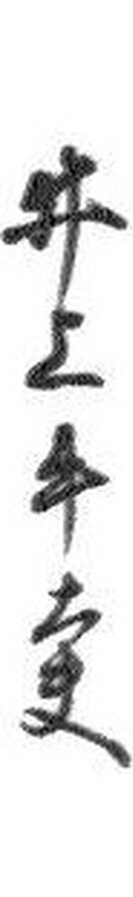井上牛大夫
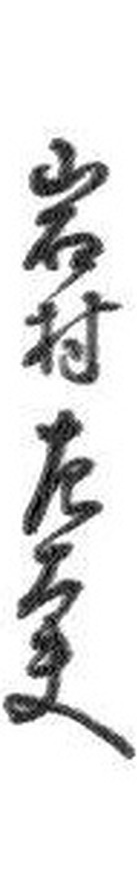岩村左大夫
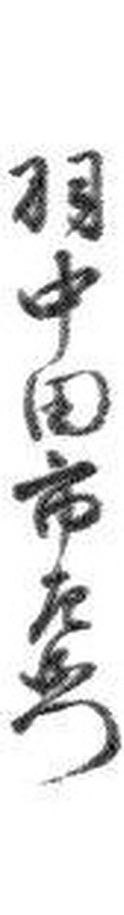羽中田市左衛門
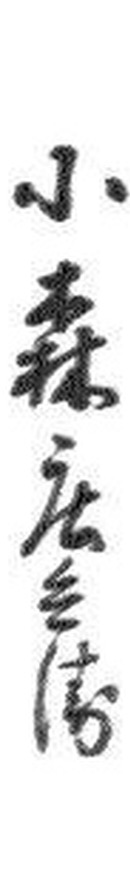小森庄兵衛
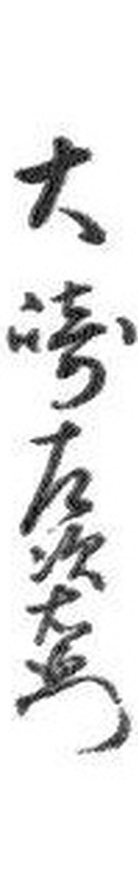大崎左次右衛門
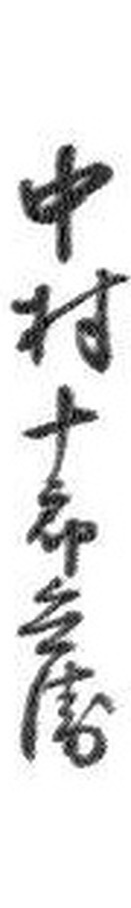中村十郎兵衛

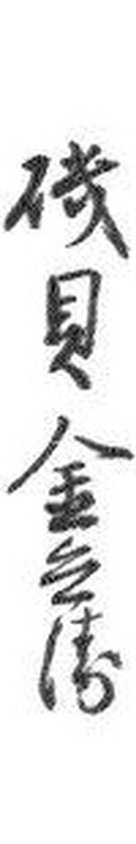磯貝金兵衛
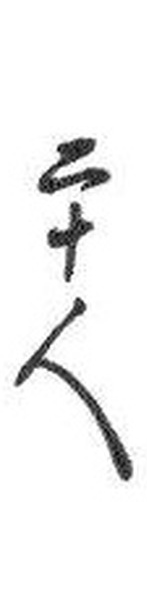二十人
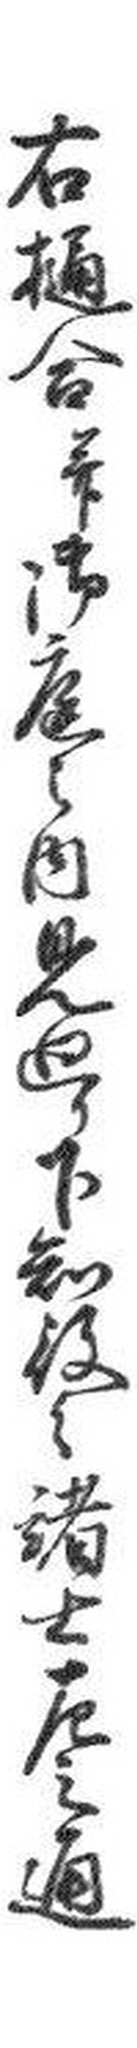右樋合并御庭之内見廻り下知役之者諸士左之通
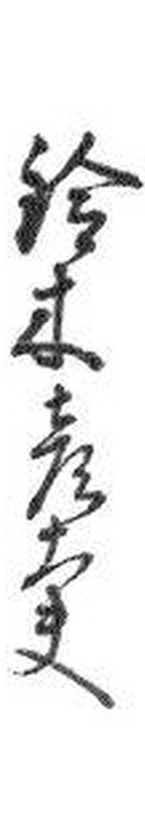鈴木彦大夫
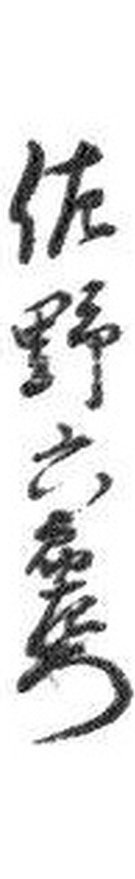佐野六郎左衛門
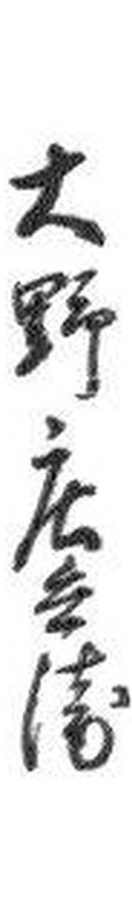大野庄兵衛
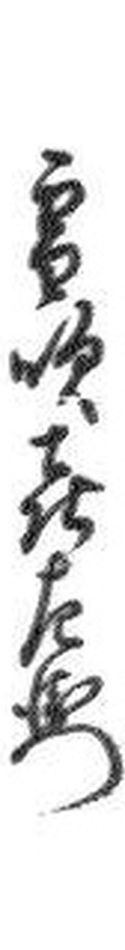雪吹喜左衛門
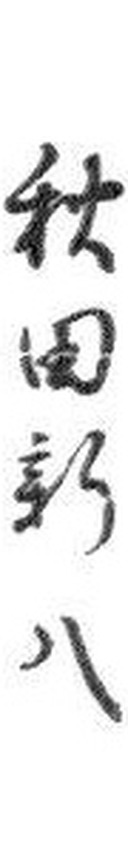秋田新八
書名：家譜 八 光通公 従寛文十年到同十二年
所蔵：福井県文書館 Fukui Prefectural Archives
